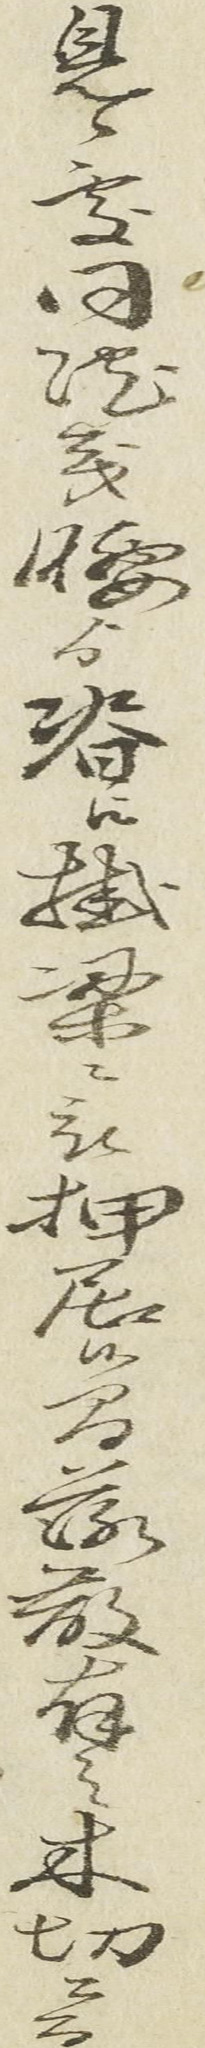見候処同院義腰ゟ背え掛梁ニ被押居候間落散有之木切ニ而
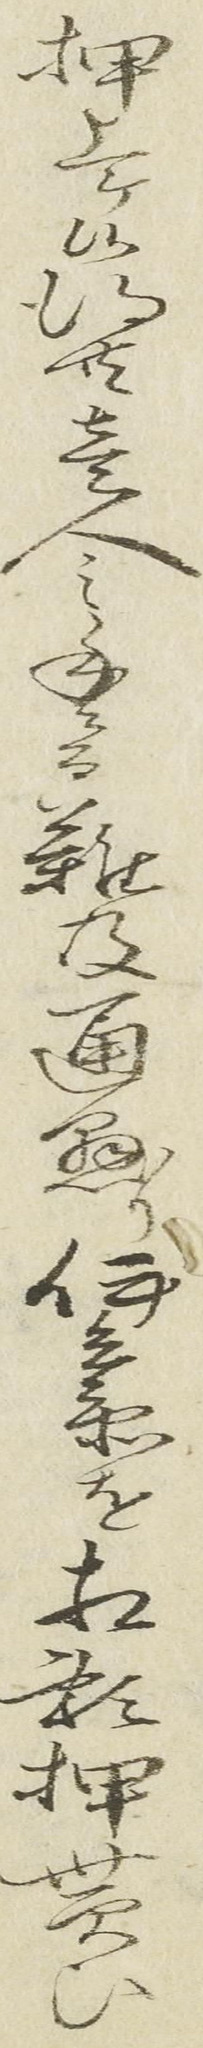押上ケ候得共壱人之手ニ而難及通懸り伊兵衛を相頼押貰ひ
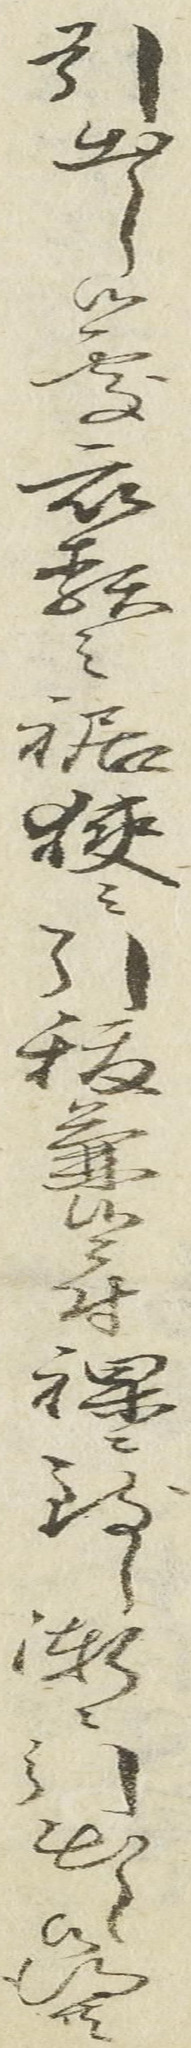引出し候処衣類之裾狭ミ引抜兼候ニ付裸ニ致し漸ニ引出し候得共
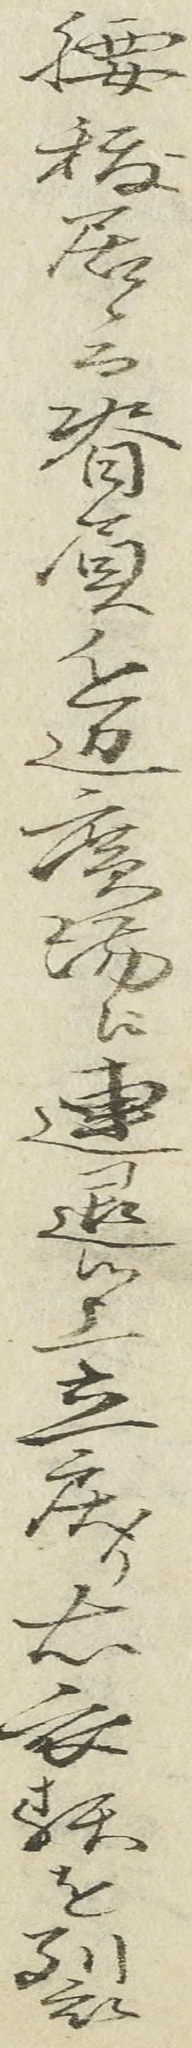腰抜居候而背負近辺広場え連退候上立戻り右衣類を裂
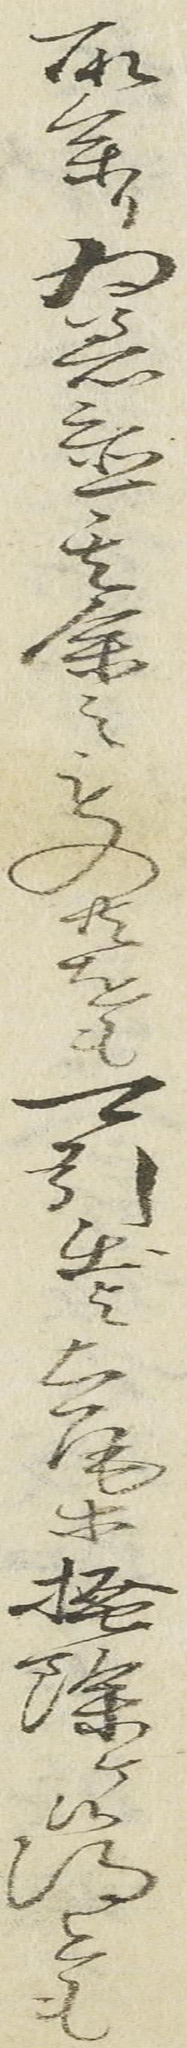取参為着置其余之もの共をも可引出と土瓦等掻除ケ候得とも
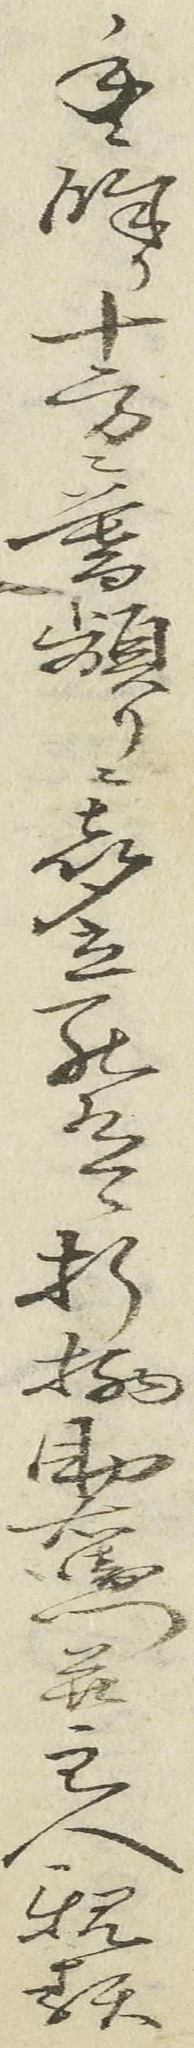手ニ餘り十方ニ暮頻りニ声立罷有候折柄助右衛門幷主人親族
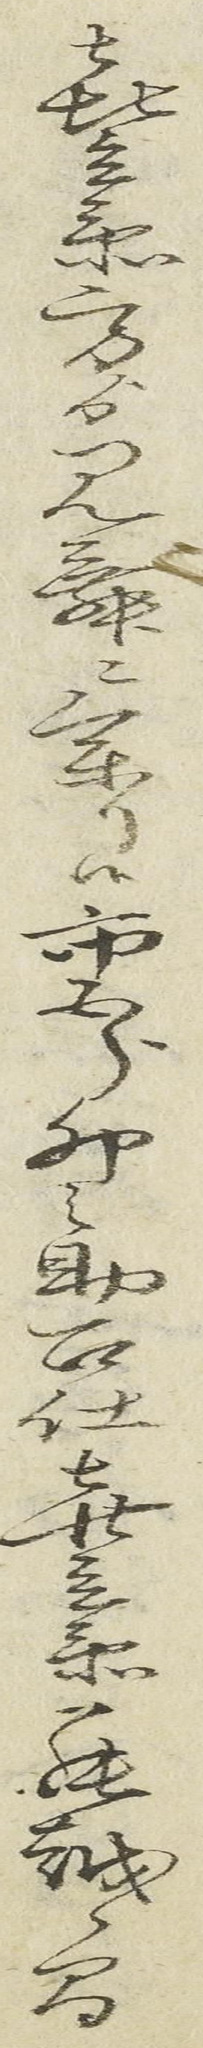喜兵衛方ゟ見舞ニ参り候市五郎卯之助召仕喜兵衛罷越候間
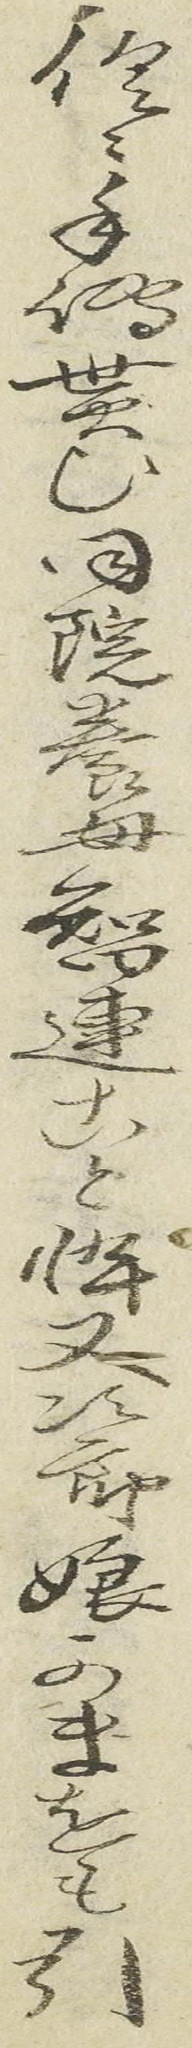倶ニ手伝貰ひ同院養母智連こと倅又次郎娘かまをも引

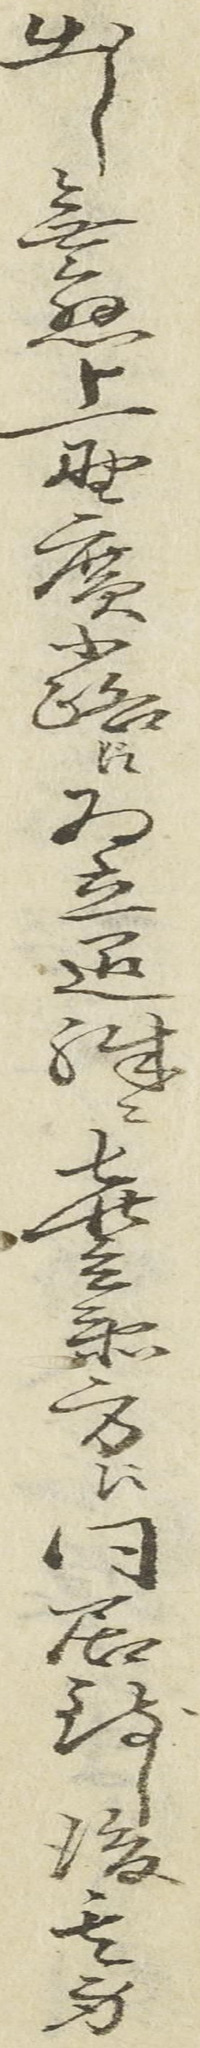出し無応上野広小路え為立退殊に喜兵衛方え同居致し後其身
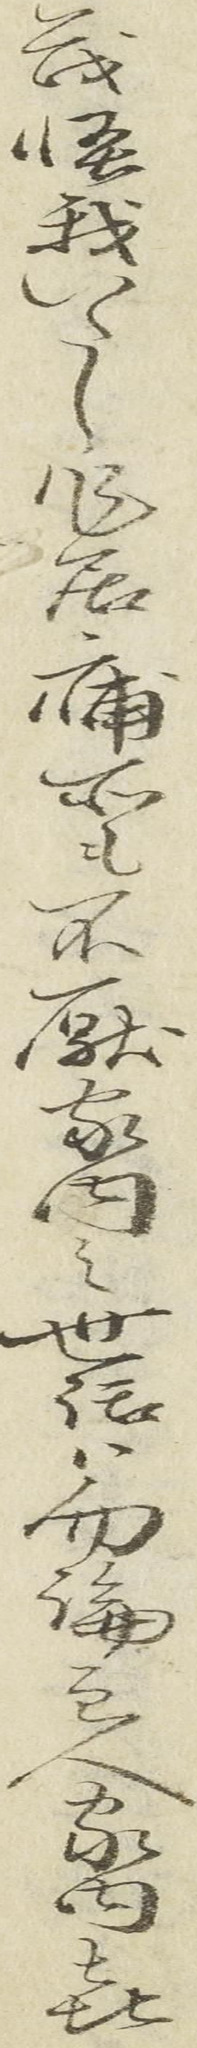も怪我いたし乍居痛所も不厭家内の世話は勿論主人家内喜
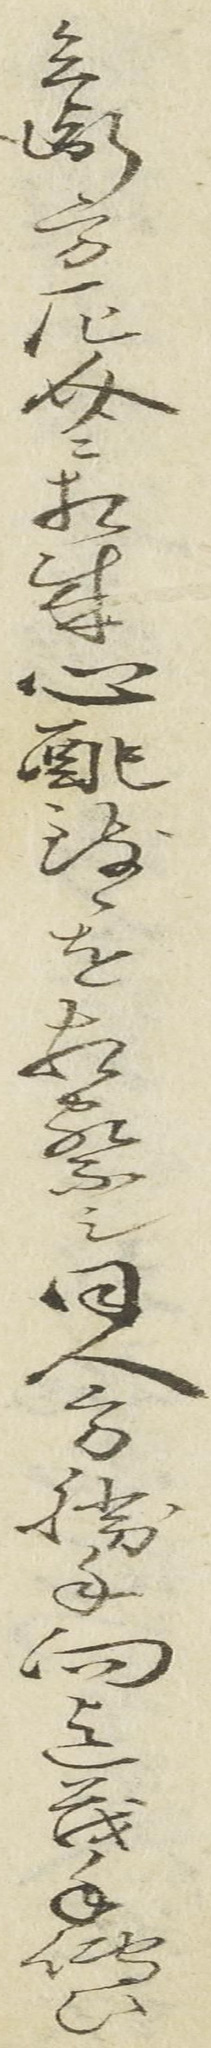兵衛方厄介に相成心配致候を相察し同人方勝手向迄も手伝ひ
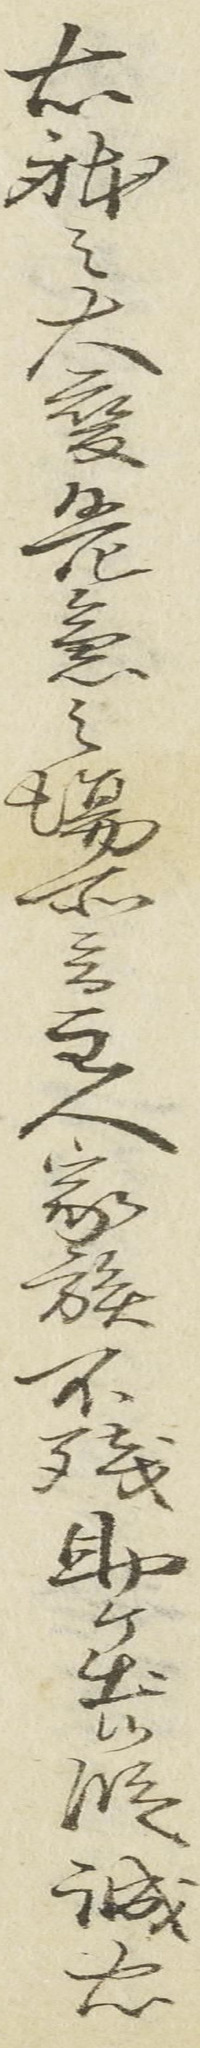右躰の大変危急の場所にて主人家族不残助け出候段誠忠
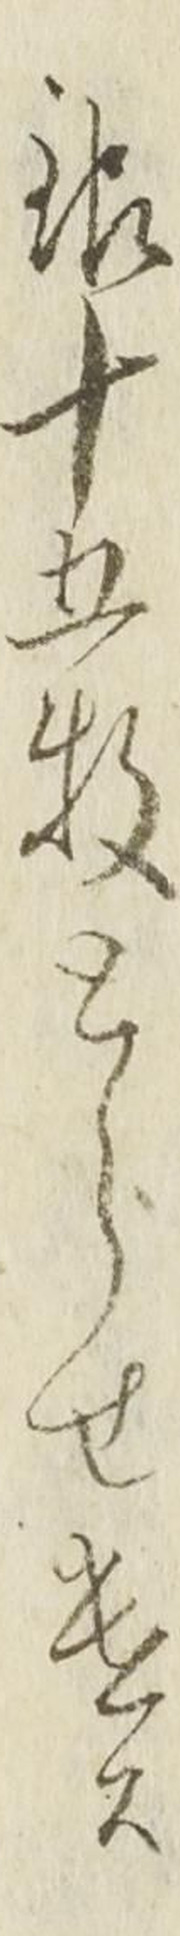銀十五枚とらせ遣す
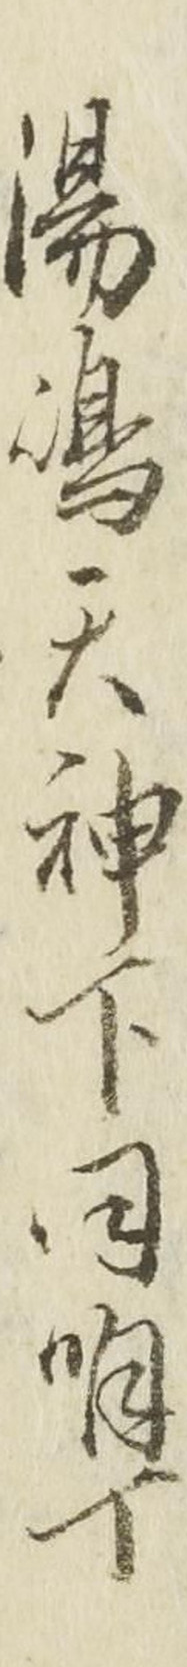湯島天神下司明丁
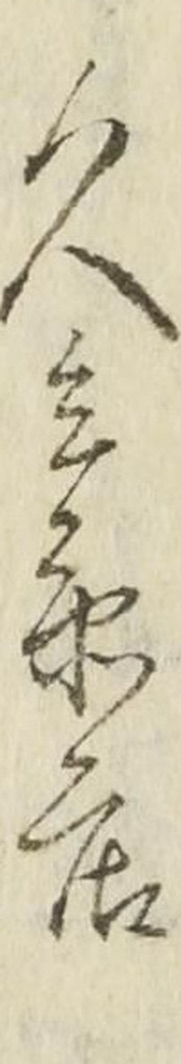久兵衛店
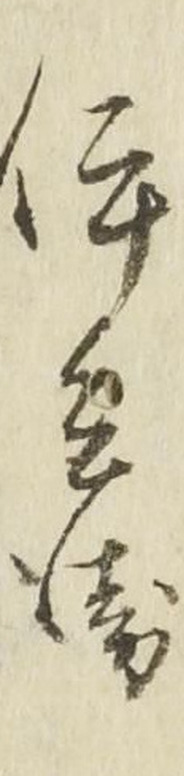伊兵衛
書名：安政二乙卯年十月二日大地震之事
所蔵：東京大学地震研究所図書室 Earthquake Research Institute Library, The University of Tokyo, JAPAN
